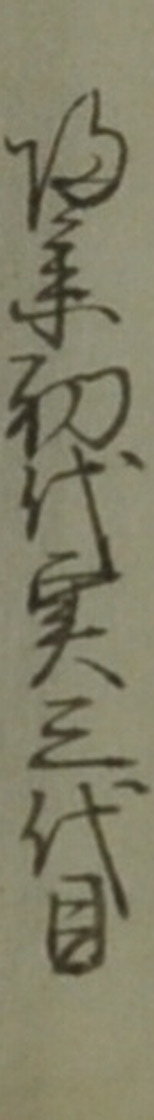帰参初代実三代目
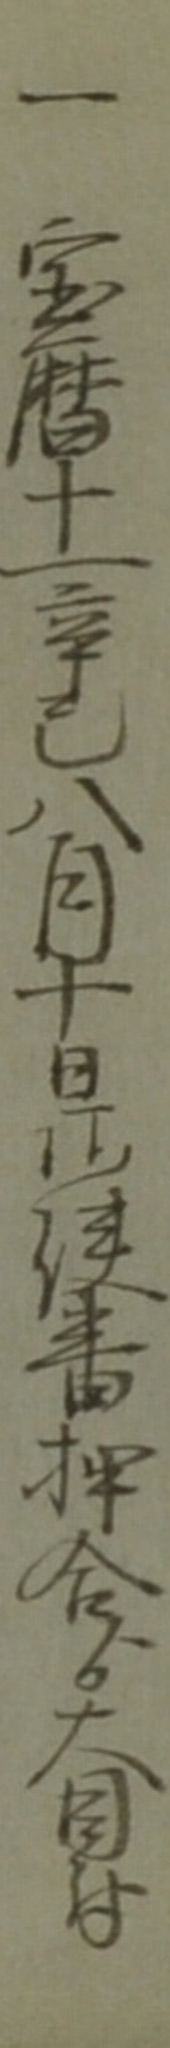一宝暦十一辛巳八月十日御使番押合ゟ大目付
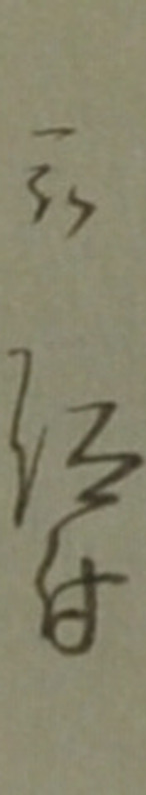被仰付
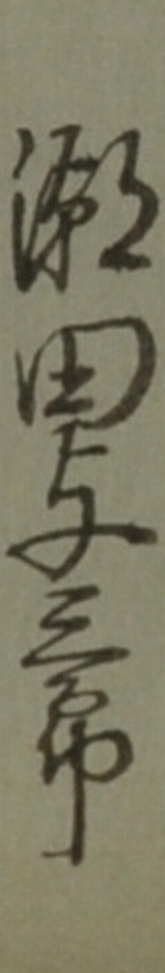瀬田与三郎
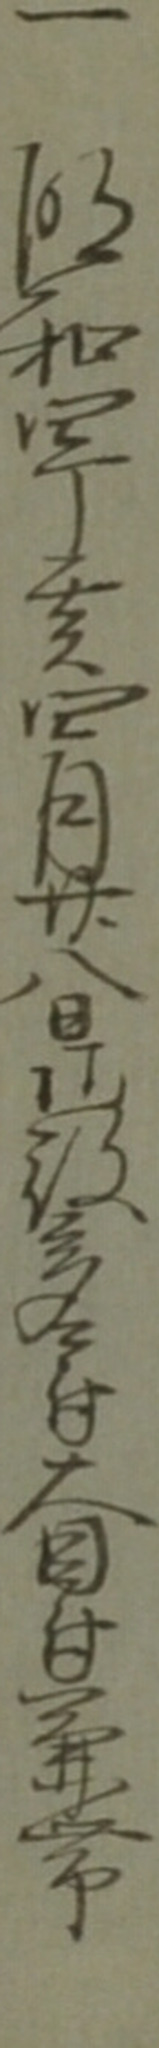一明和四丁亥四月廿八日御役多ニ付大目付兼帯
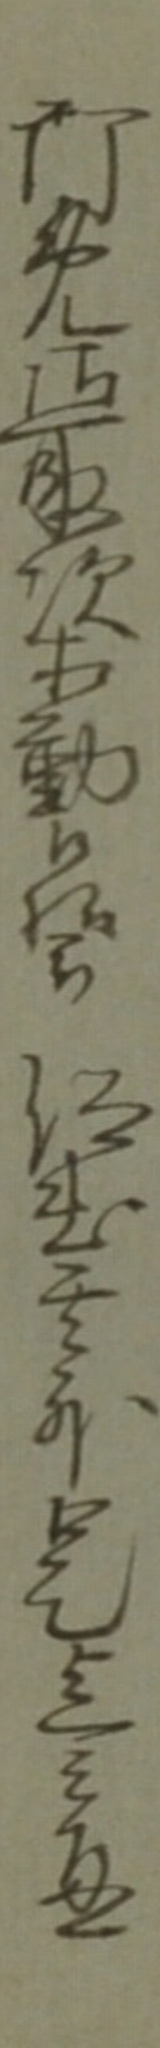御免御取次相勤候様被仰出其外是迄之通
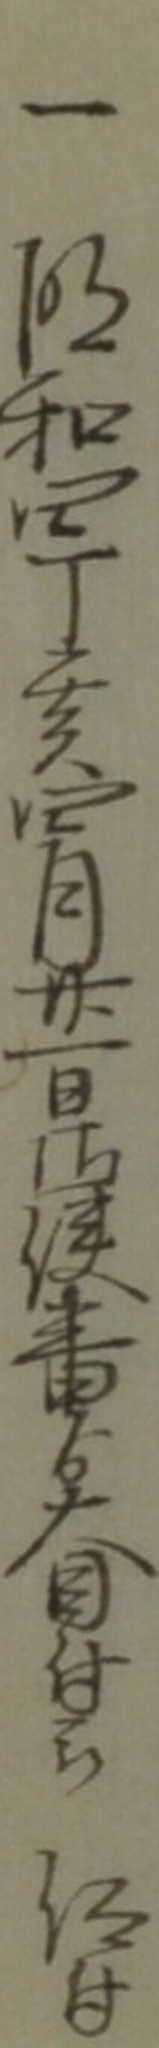一明和四丁亥四月廿一日御使番ゟ大目付被仰付
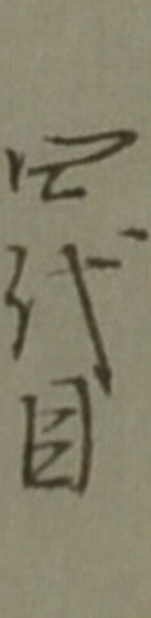四代目
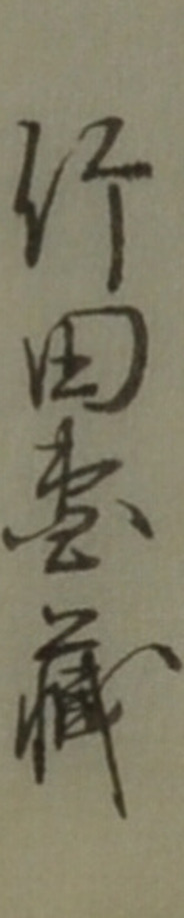竹田団蔵
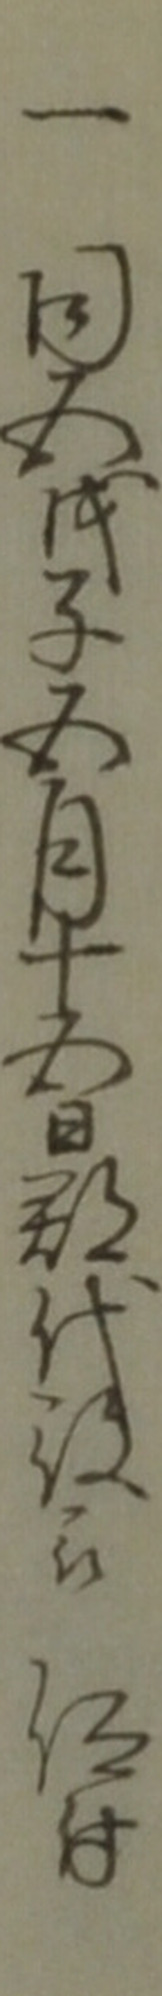一同五戊子五月十五日郡代役被仰付
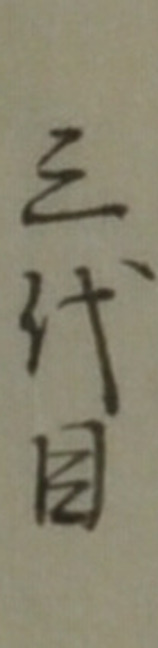三代目
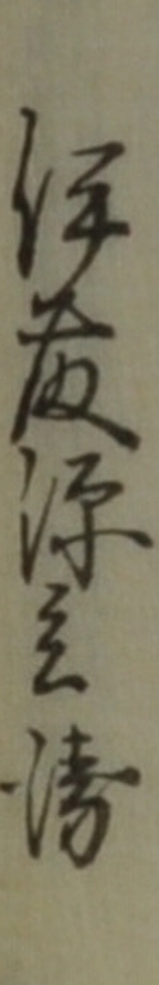伊藤源兵衛
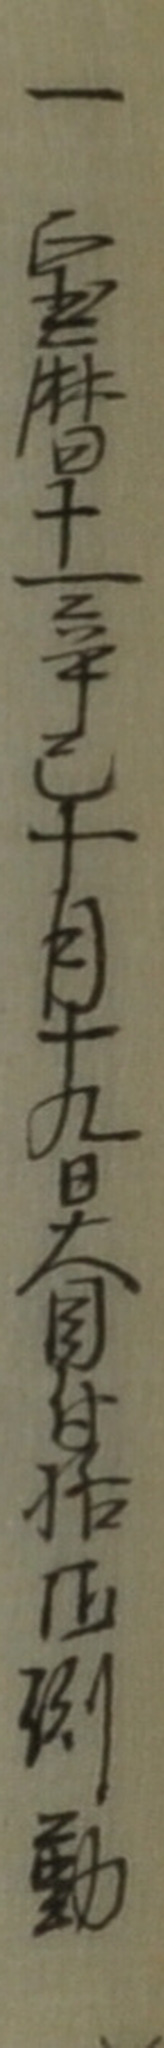一宝暦十一辛巳十月十九日大目付格御側勤
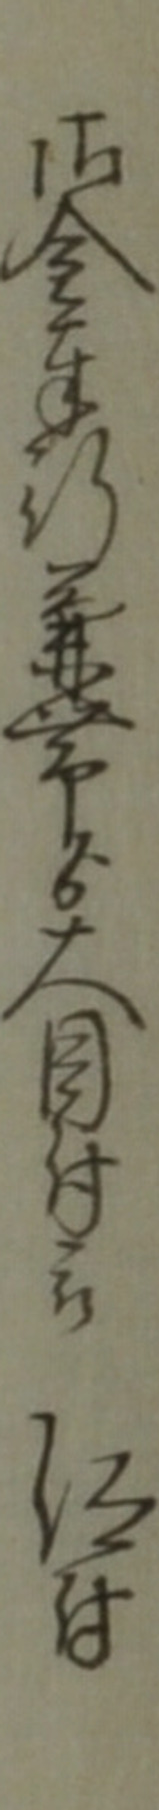御金奉行兼帯ゟ大目付被仰付
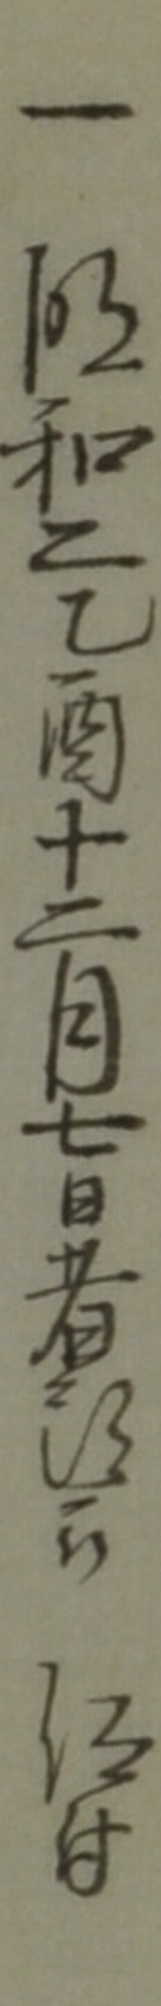一明和二乙酉十二月七日者頭被仰付
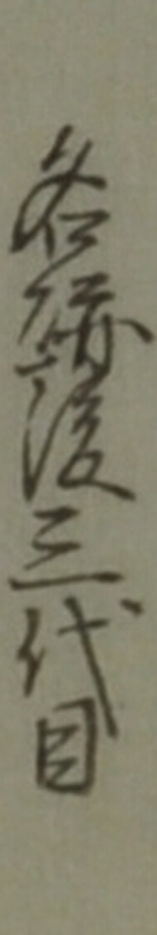名跡後三代目
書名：諸御役代々録（三）
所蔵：伊那市立高遠町図書館・合同会社AMANE
